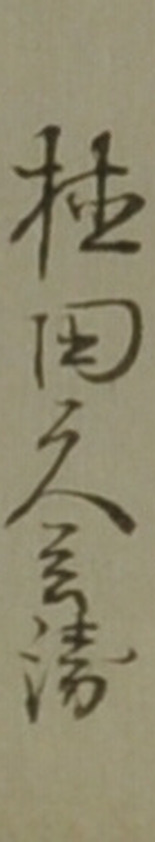植田久兵衛
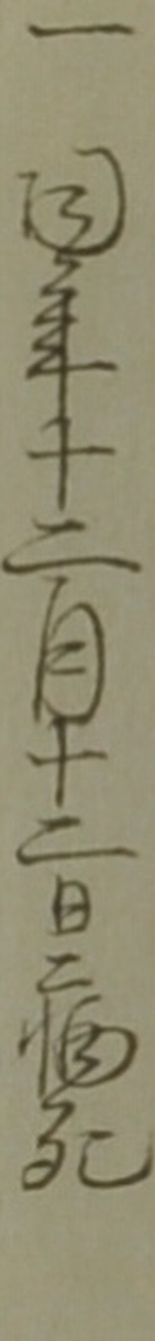一同年十二月十二日病死
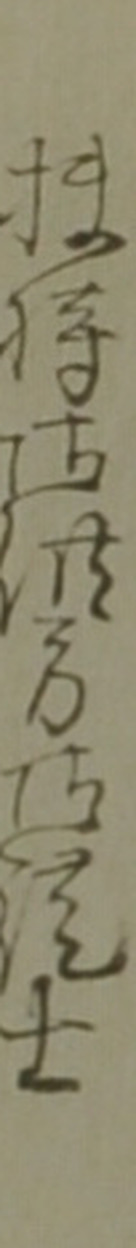扶持御供方御徒士

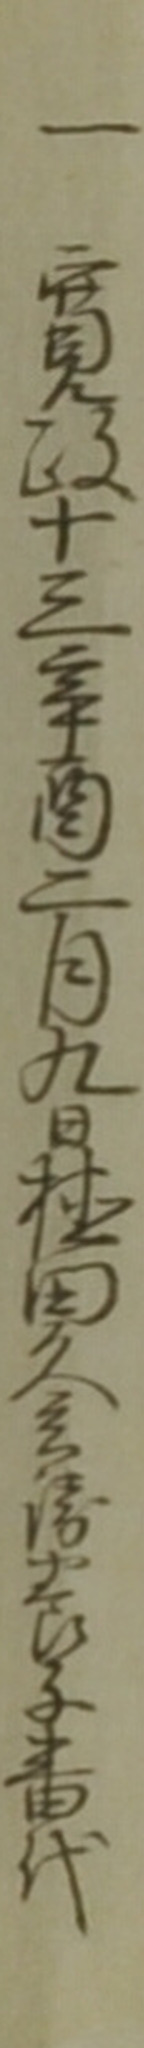一寛政十三辛酉二月九日植田久兵衛養子番代
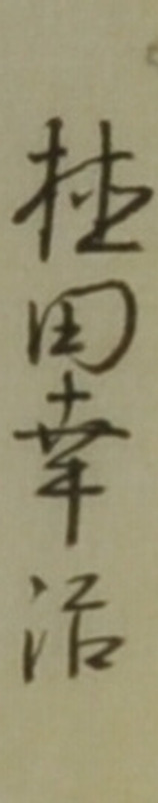植田幸治
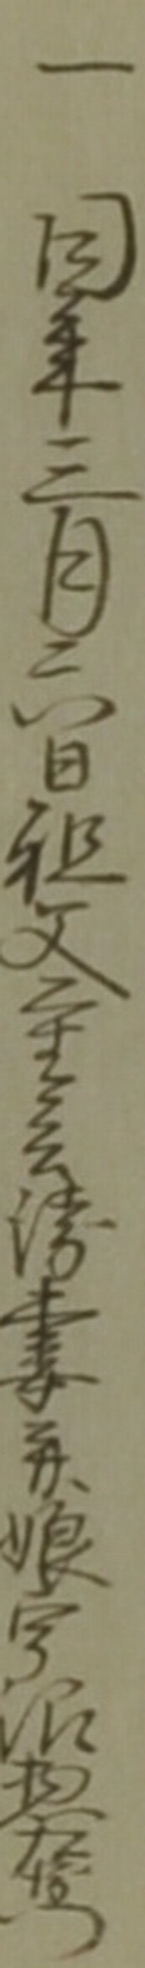一同年三月六日祖父重兵衛妻并娘宇沼惣左衛門
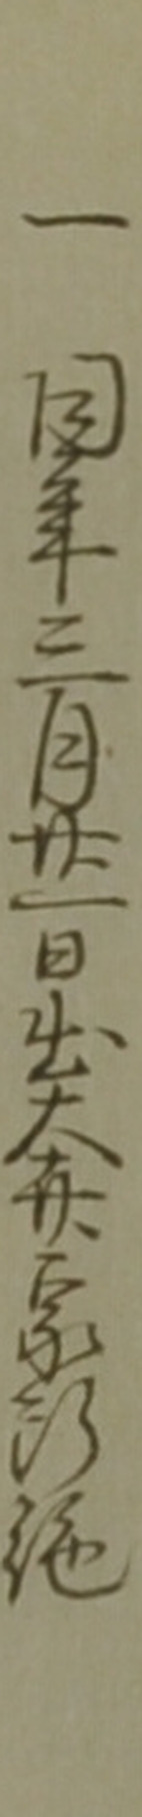一同年三月廿一日出奔家断絶
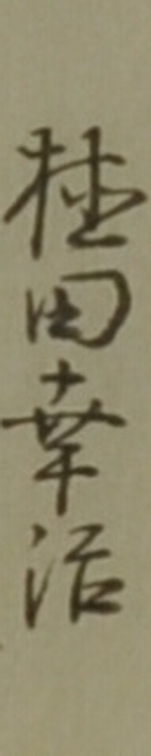植田幸治
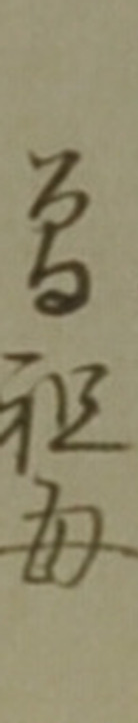曽祖母
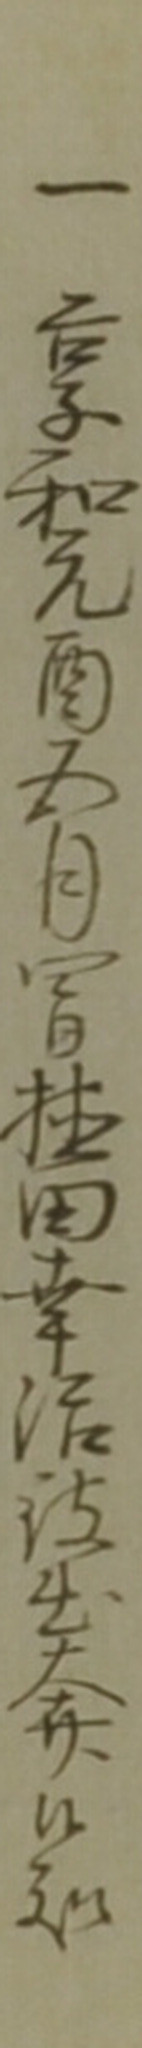一享和元酉五月四日植田幸治致出奔候処
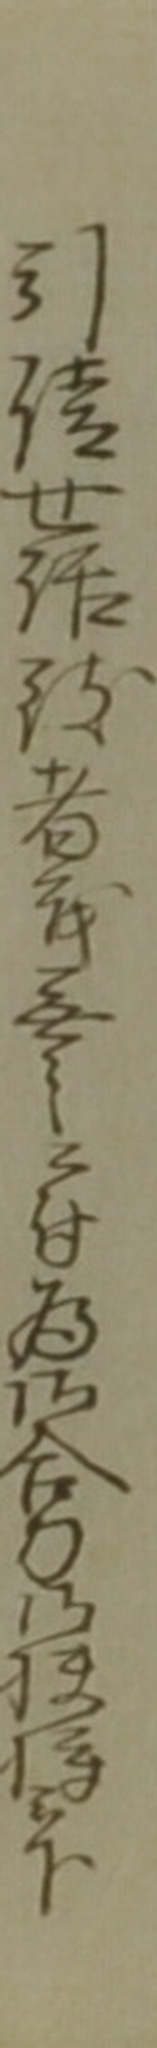引請世話致者茂無之ニ付為御合力御扶持被下
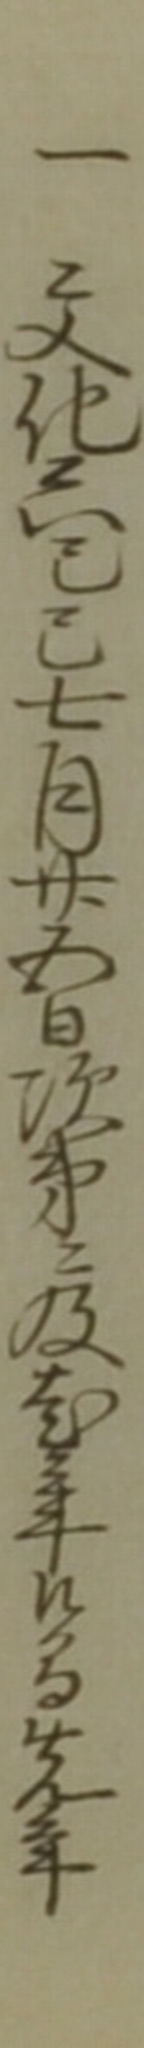一文化六己巳七月廿五日次第及老年候間先年
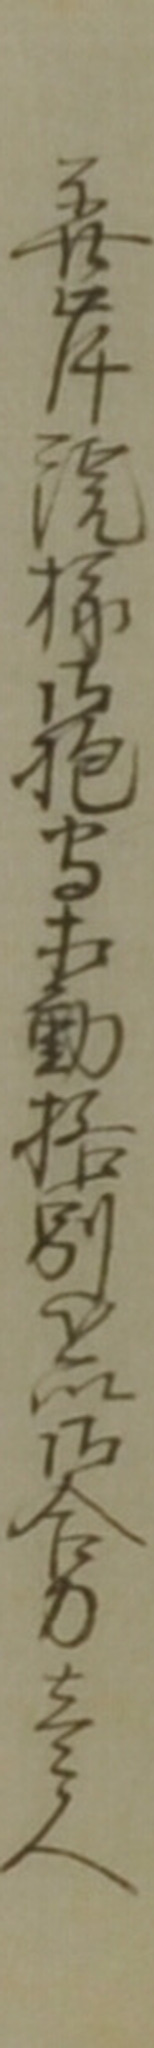善岸院様御抱守相勤格別を以御合力壱人
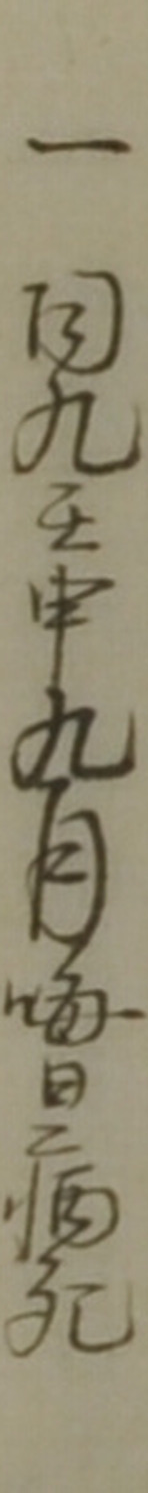一同九壬申九月晦日病死
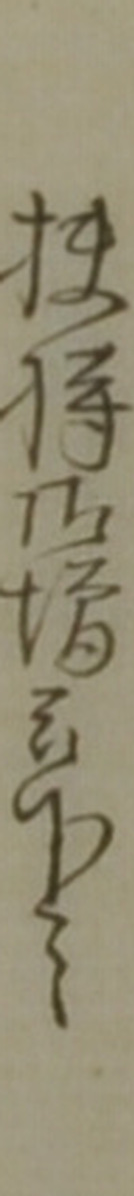扶持御増被下之
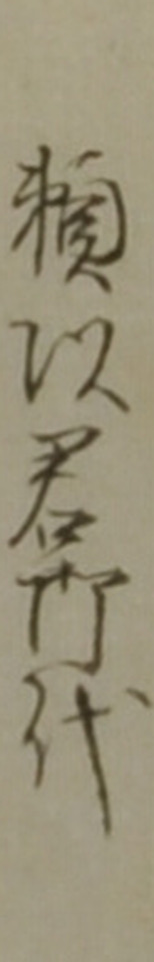頼以君御代
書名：無足廃家（壱）
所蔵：伊那市立高遠町図書館・合同会社AMANE
